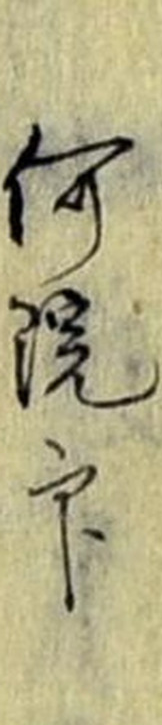何寺印
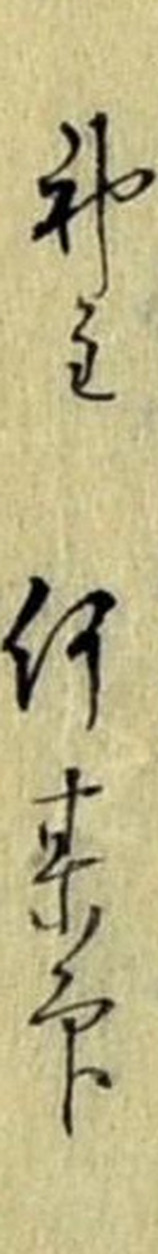神主何某印
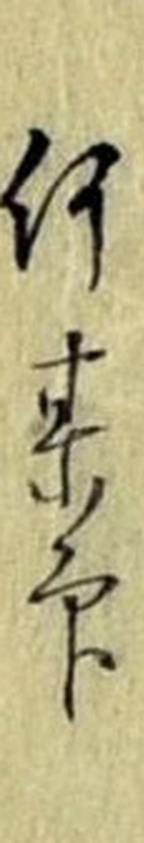何某印
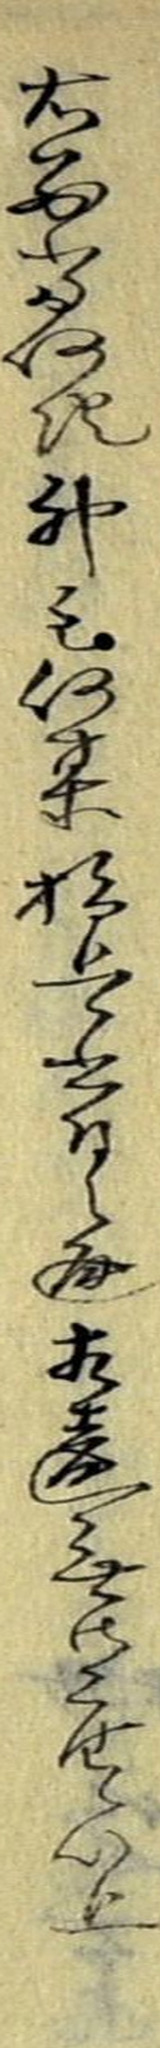右別当何院神主何某指上候書付之通相違無御座候以上

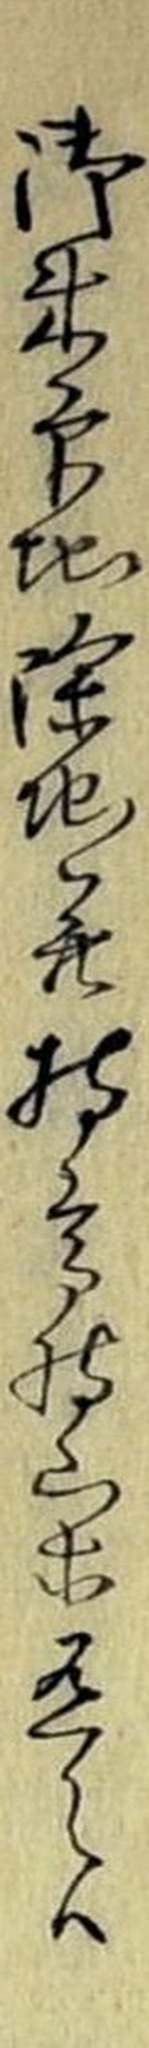御朱印地除地并持高持山等有之ハ
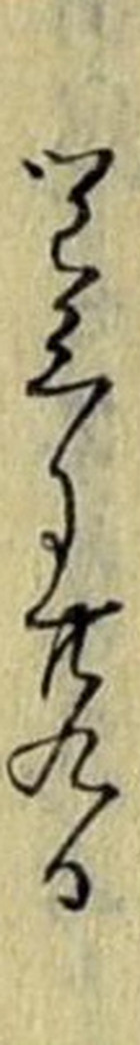閏三月廿九日
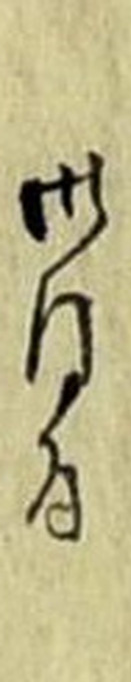御目付
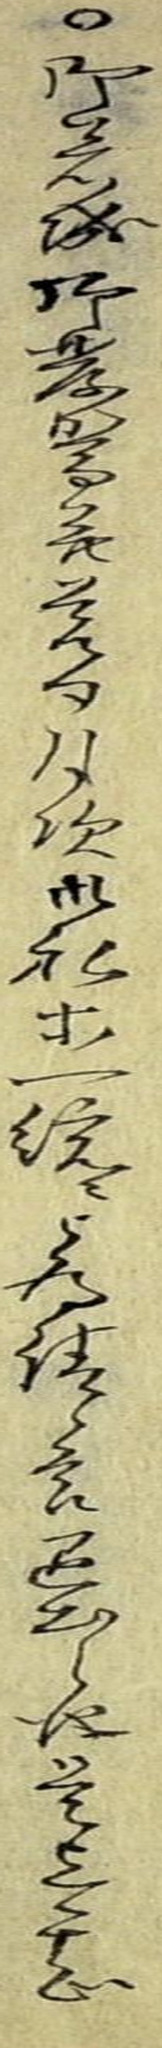○着城御発駕并節句月次御礼等一統ニ被為請候節退出之儀是迄甚
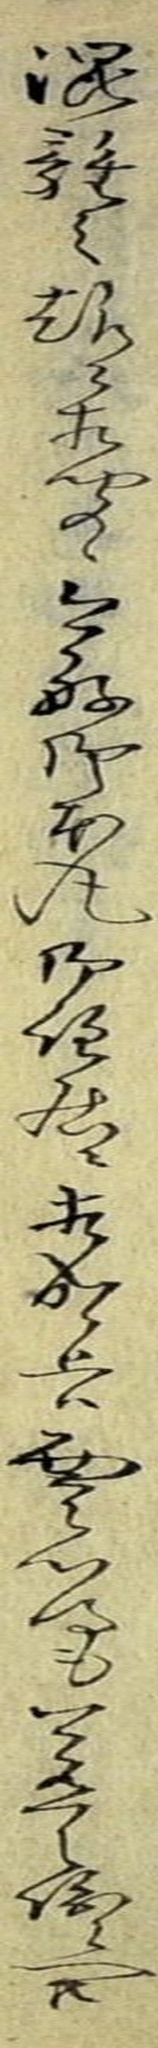混雑之趣ニ相聞候今般御本丸御住居ニ相成候上ハ面々心得可有之儀候へ共
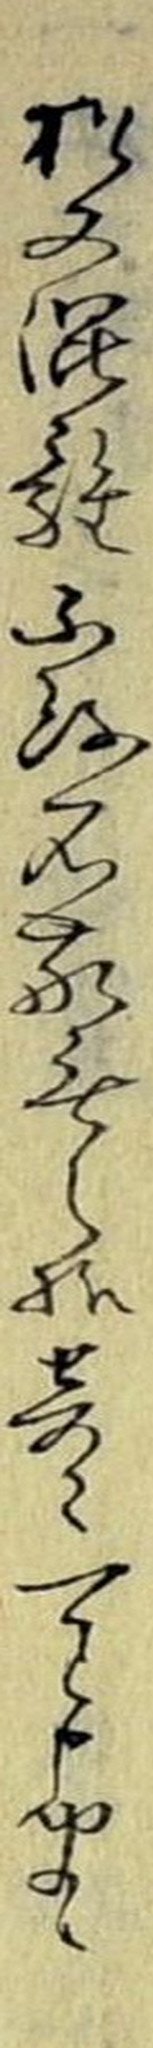猶又混雑不致不敬無之様寄々可申聞候
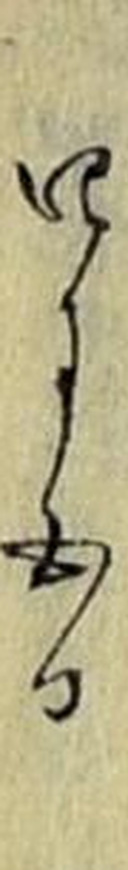四月五日
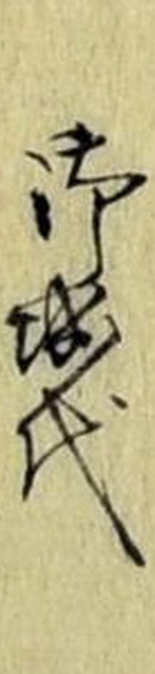御城代
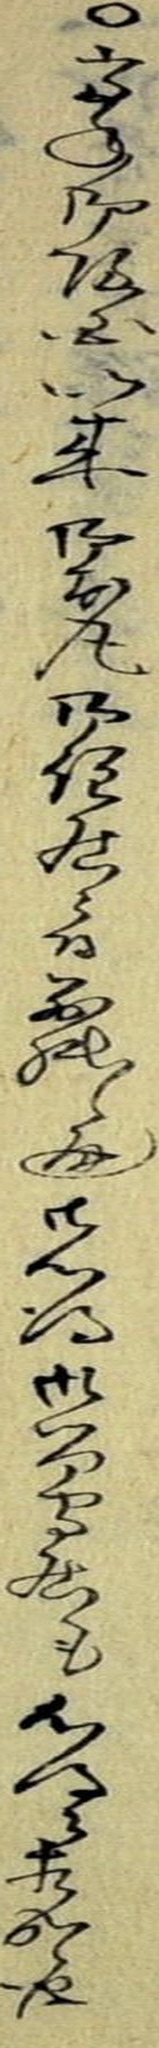○当年御帰国以来御本丸御住居ニ付別紙之通相心得御留守居へも心得ニ相成候儀
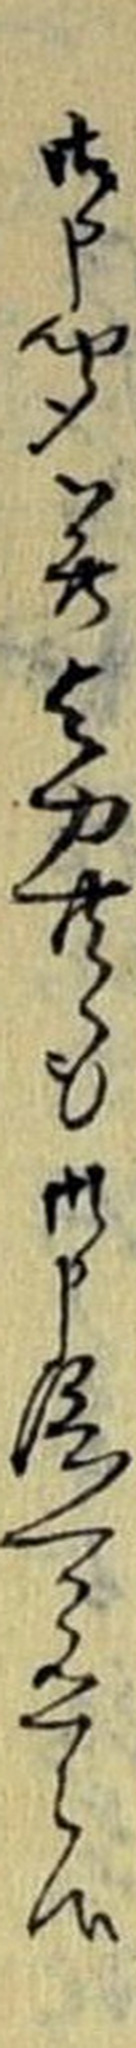相申聞并与力へも御申渡可有之候
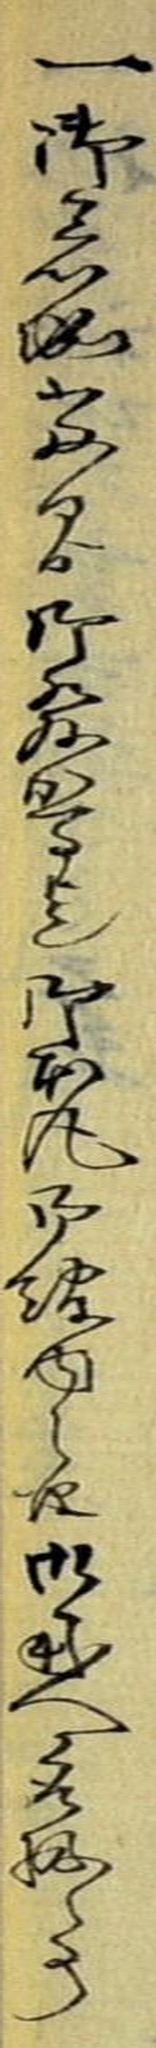一御着城当日ゟ御発駕迄御本丸御館内之儀御用人取扱候事
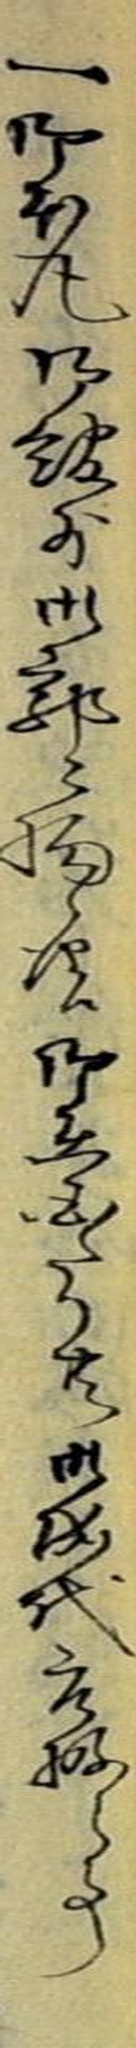一御本丸御館外御郭ニ拘候儀ハ御在国たり共御城代取扱候事
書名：命令之部 五
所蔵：福井県文書館 Fukui Prefectural Archives
